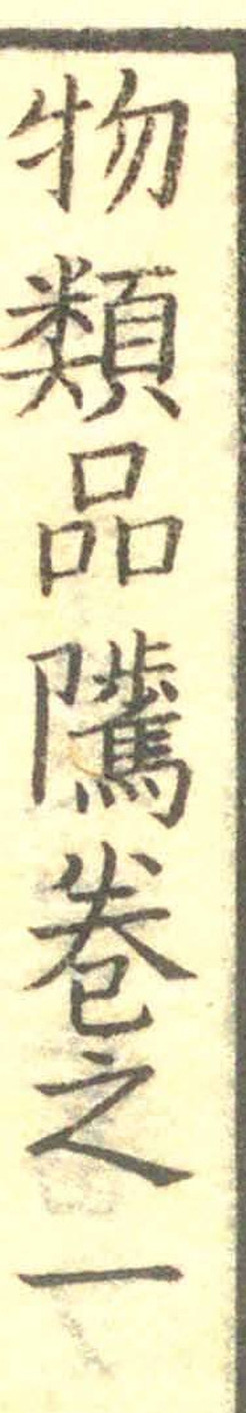物類品隲巻之一
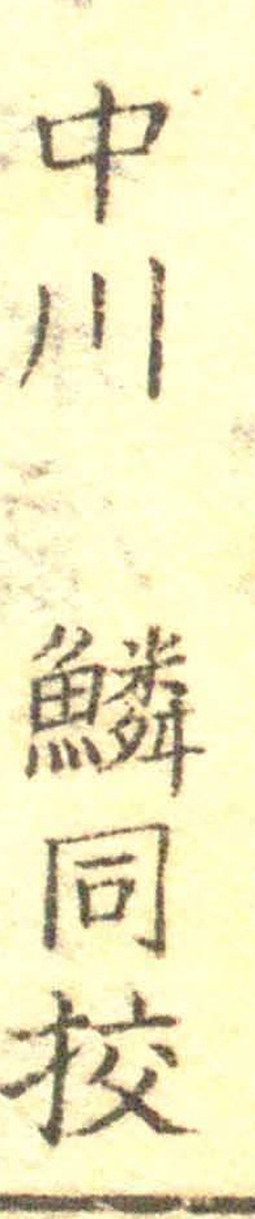中川鱗同校
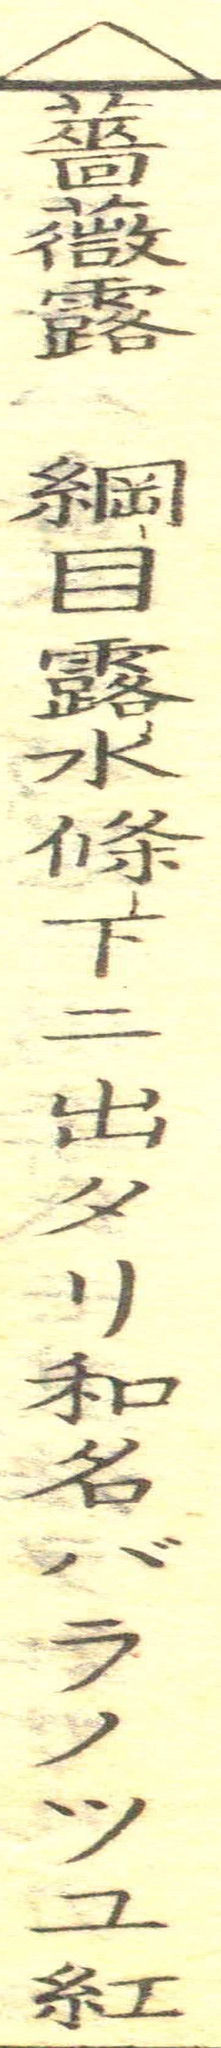薔薇露綱-目露-水条-下ニ出タリ和名バラノツユ紅
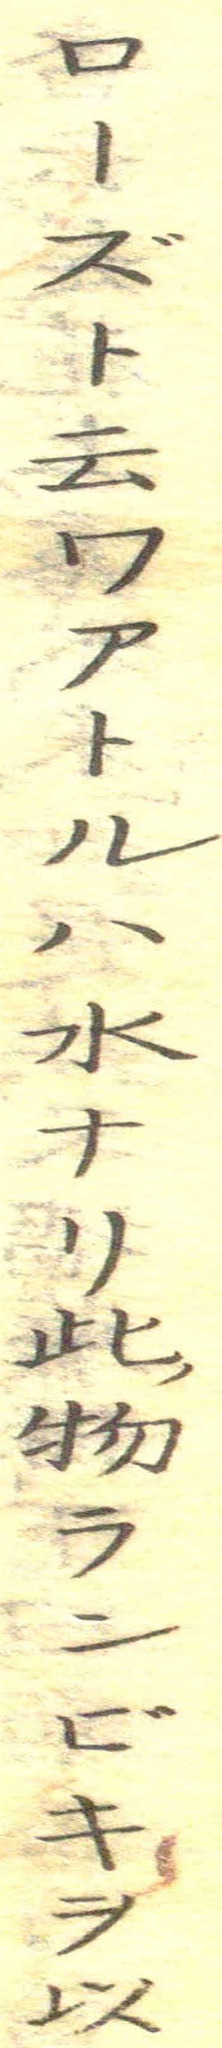ローズト云ワアトルハ水ナリ此物ランビキヲ以

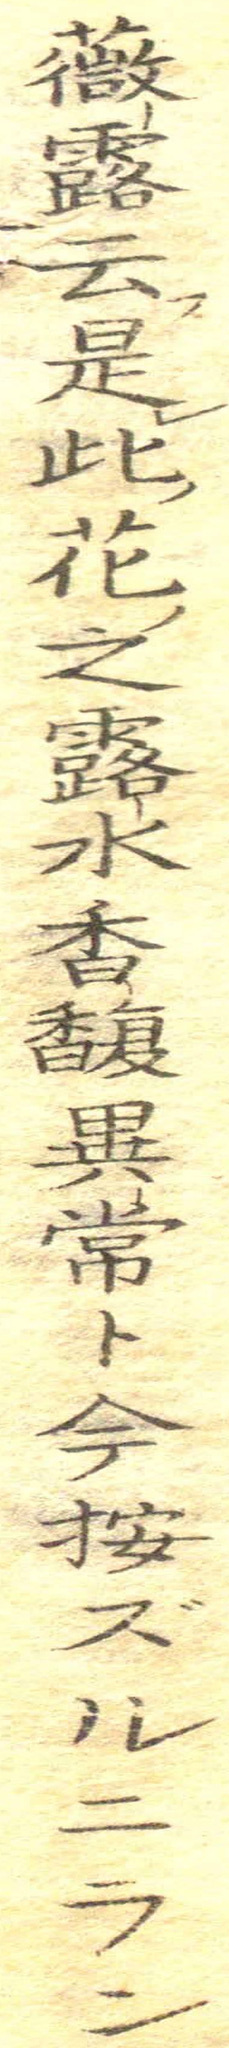薇-露云是此花之露-水香-馥異-常ト今按ズルニラン
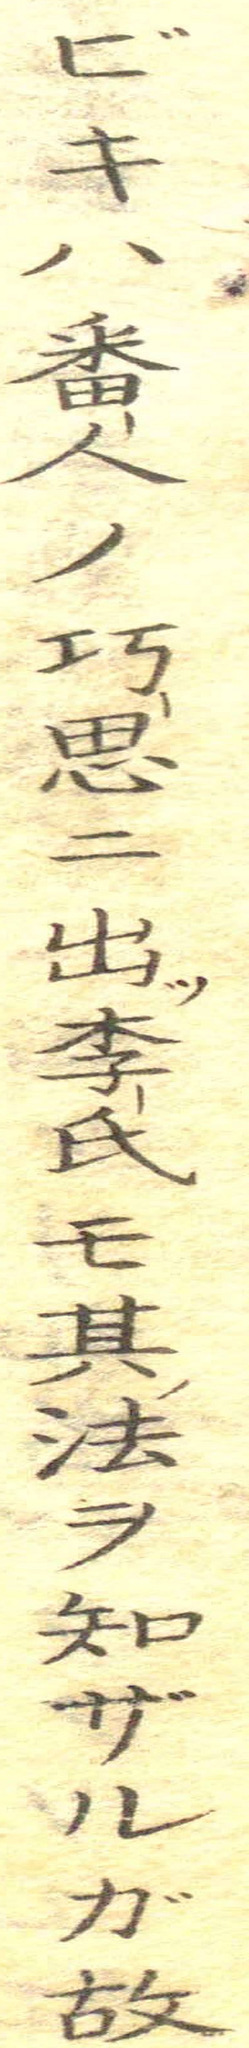ビキハ番-人ノ巧-思ニ出李-氏モ其法ヲ知ザルガ故
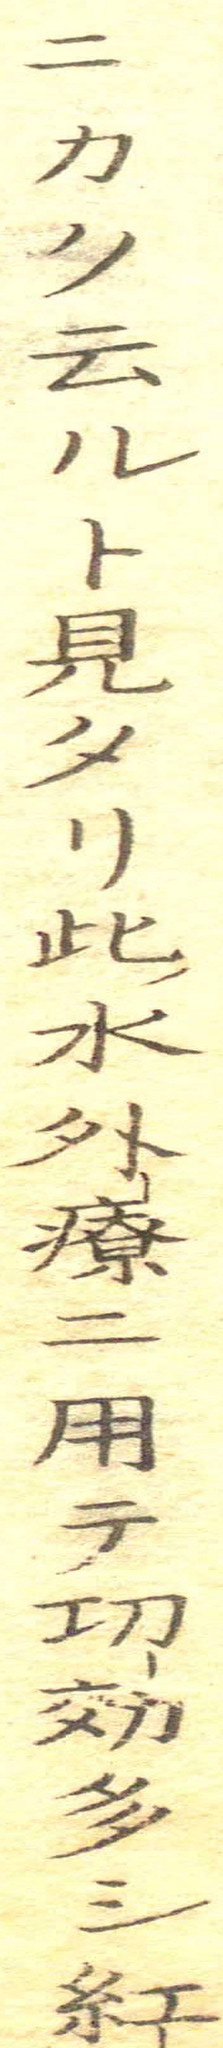ニカク云ルト見タリ此水外-療ニ用テ功-効多シ紅-
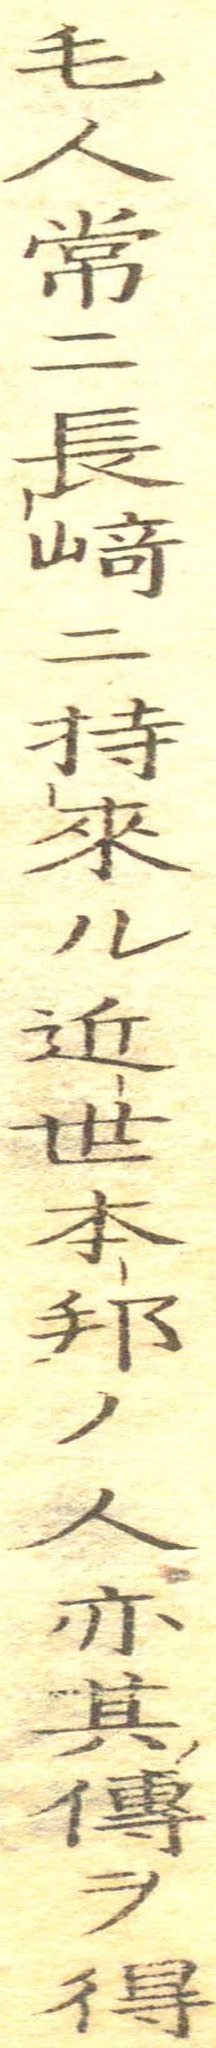毛人常ニ長-崎ニ持-来ル近-世本邦ノ人亦其伝ヲ得
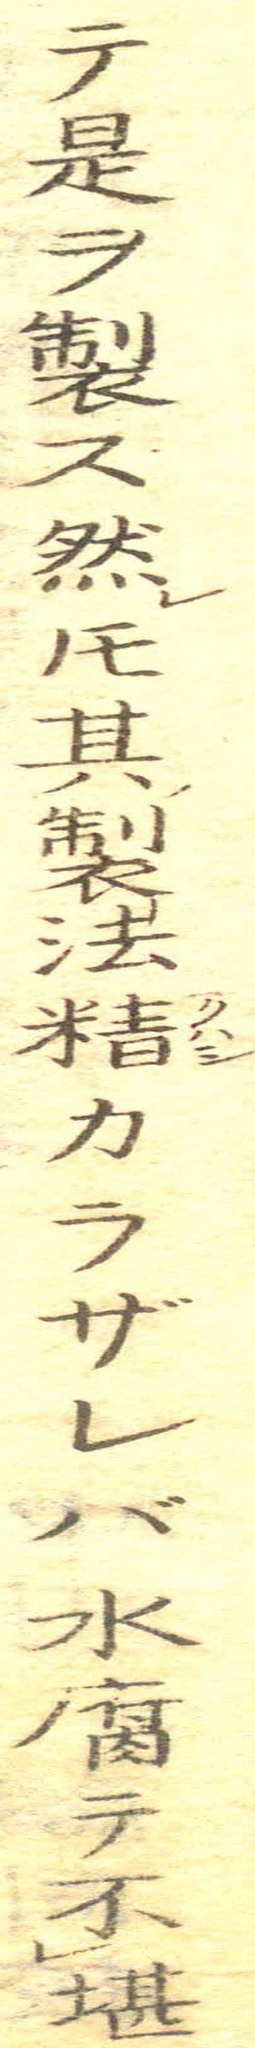テ是ヲ製ス然レトモ其製-法精カラザレバ水腐テ不堪
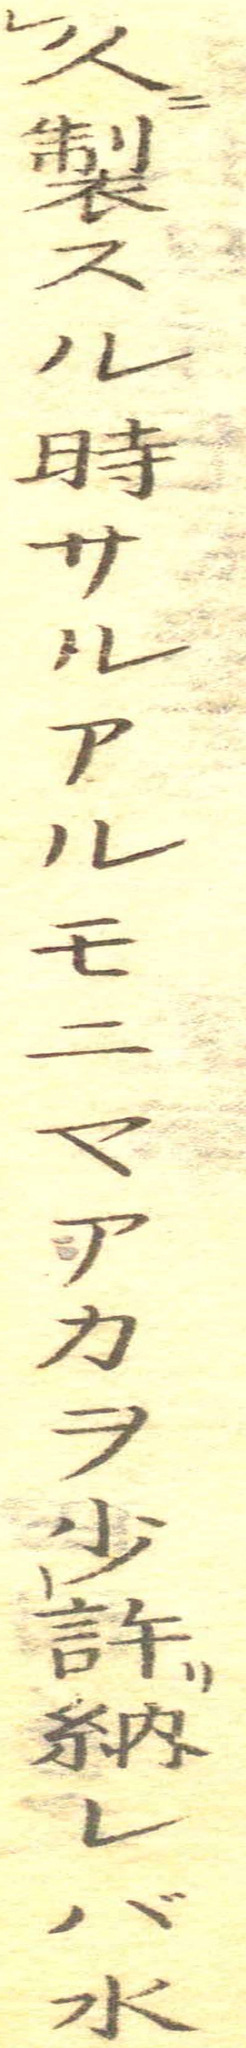久製スル時サルアルモニヤアカヲ少-許納レバ水
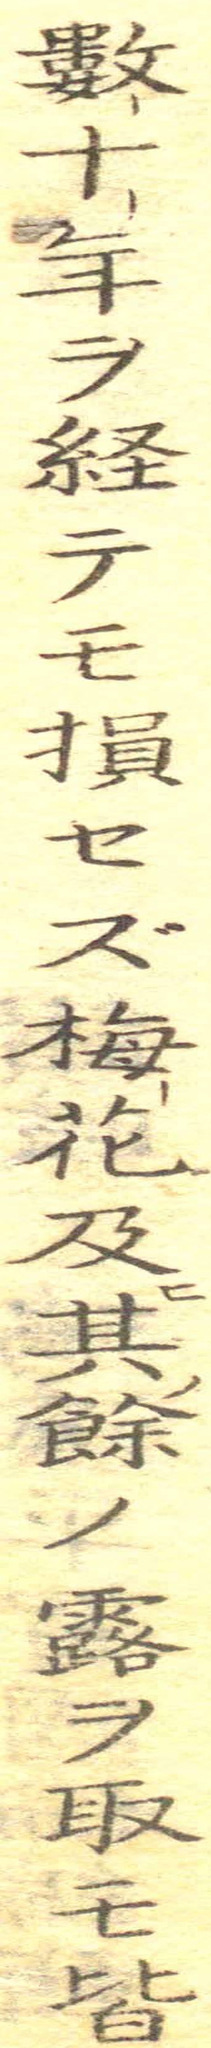数-十-年ヲ経テモ損セズ梅-花及其余ノ露ヲ取モ皆
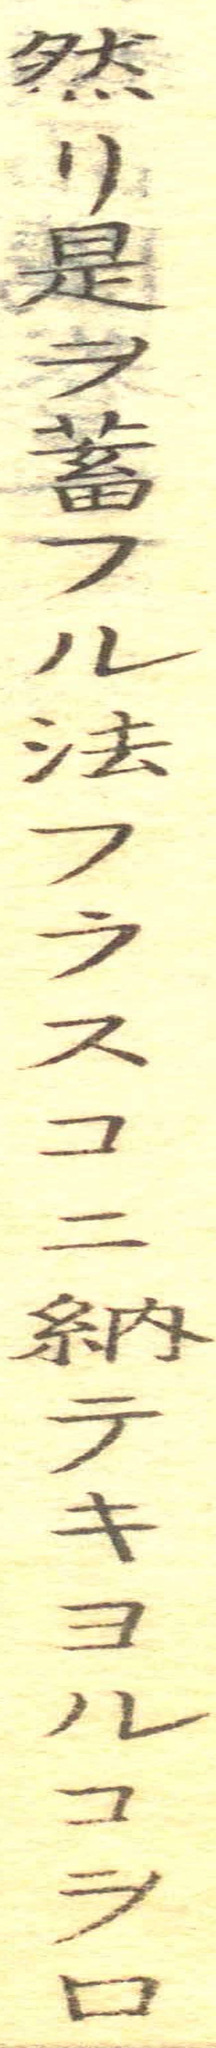然リ是ヲ蓄フル法フラスコニ納テキヨルコヲ口
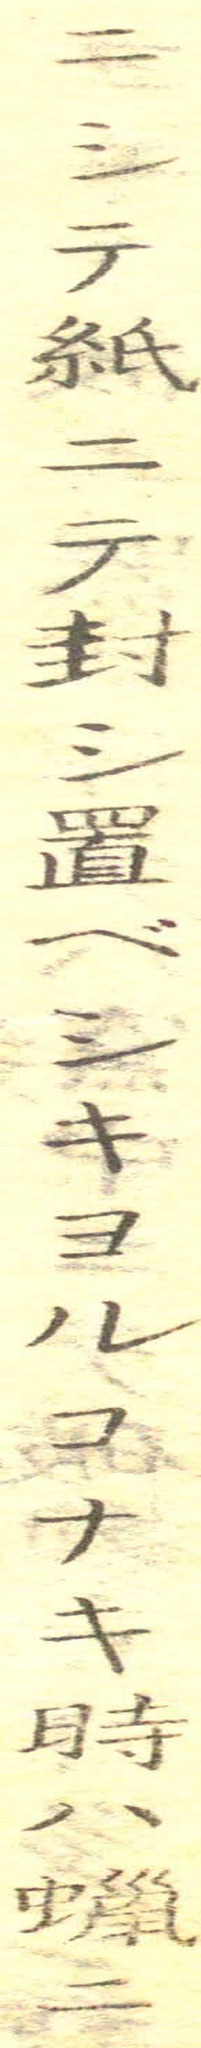ニシテ紙ニテ封シ置ベシキヨルコナキ時ハ蝋ニ
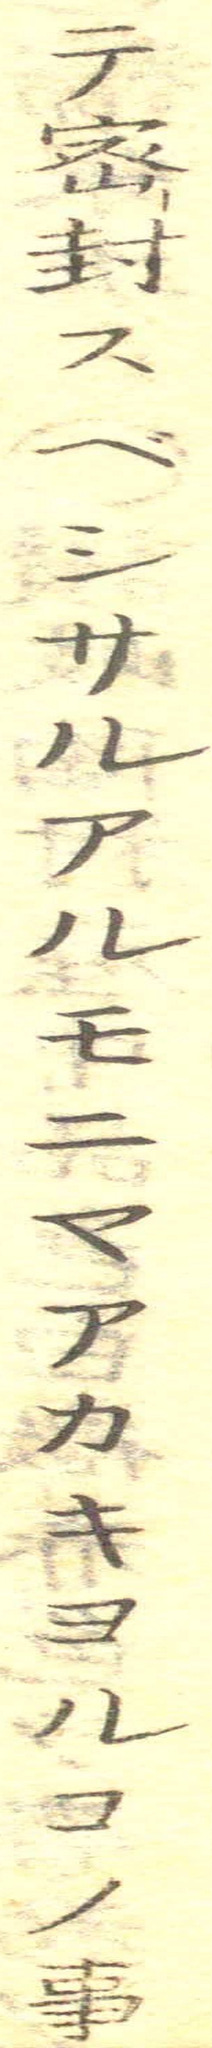テ密-封スベシサルアルモニヤアカキヨルコノ事
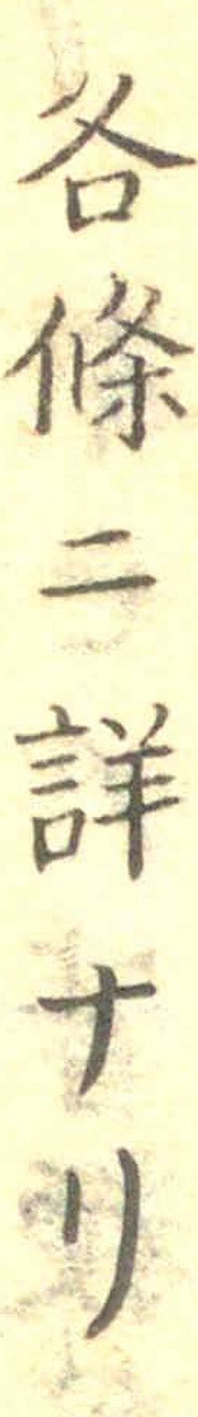各条ニ詳ナリ
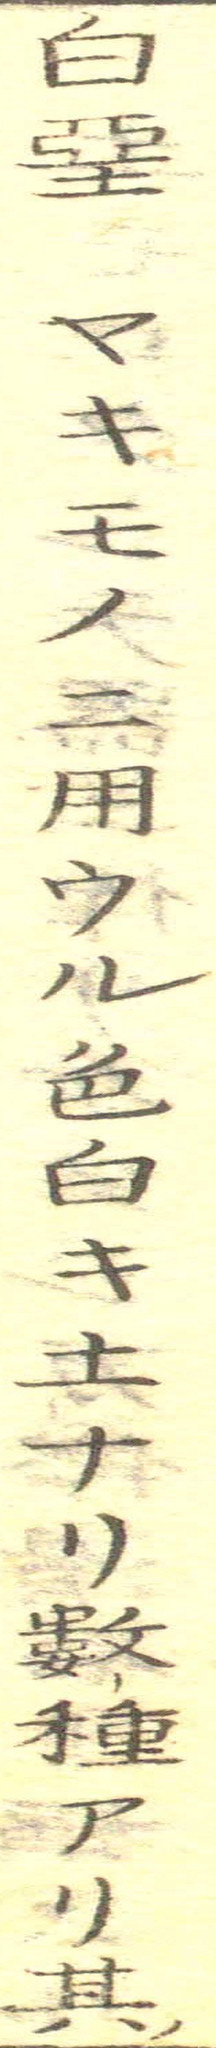白堊マキモノニ用ウル色白キ土ナリ数-種アリ其
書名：物類品隲
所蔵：国文学研究資料館
